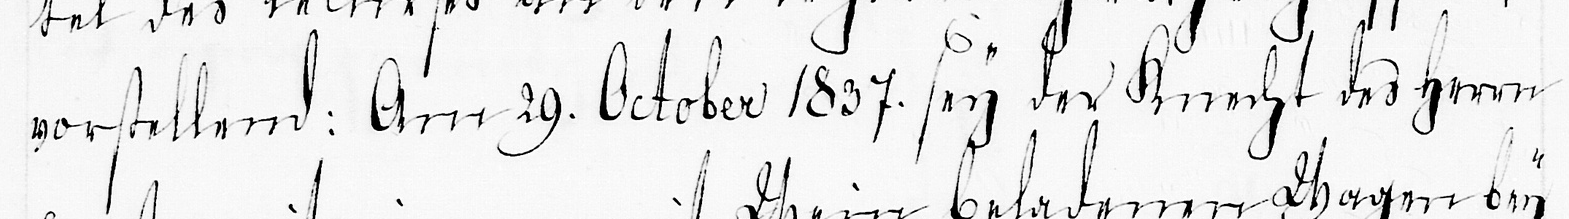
vorstellend: Am 29. October 1837. sey der Knecht des Herrn
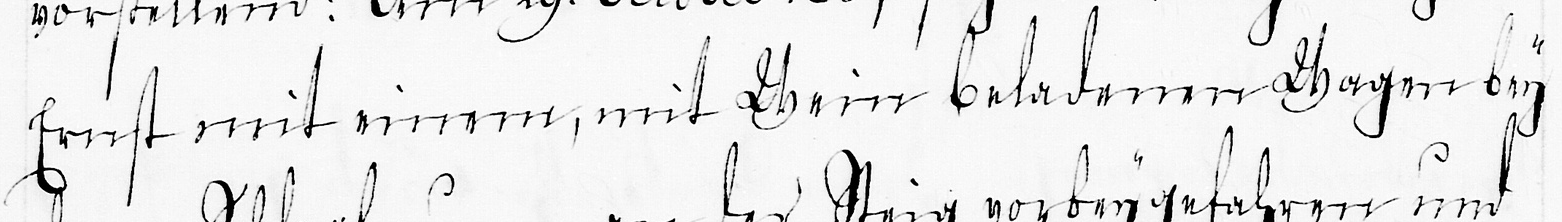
Ernst mit einem, mit Wein beladenen Wagen bey
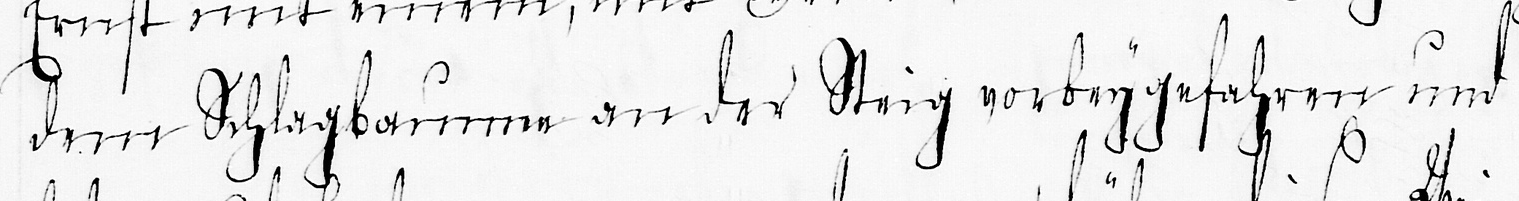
dem Schlagbaume an der Steig vorbeygefahren und
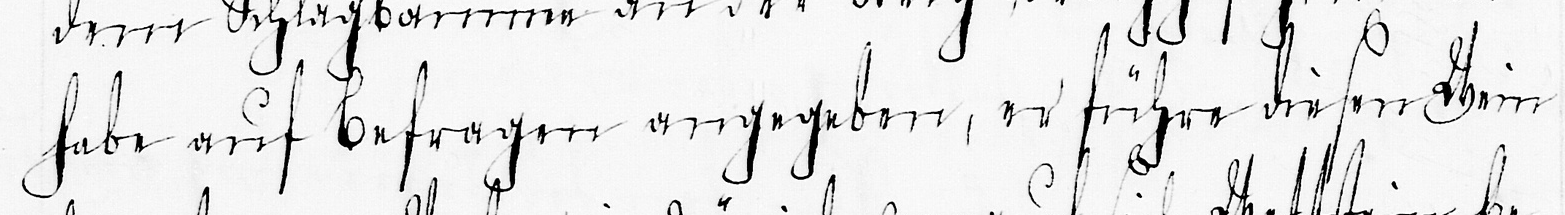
habe auf Befragen angegeben, er führe diesen Wein
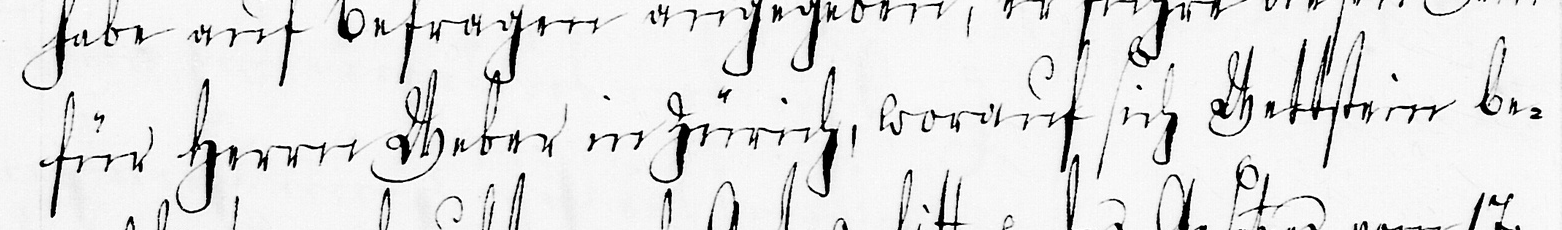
für Herrn Weber in Zürich, worauf sich Wettstein be¬
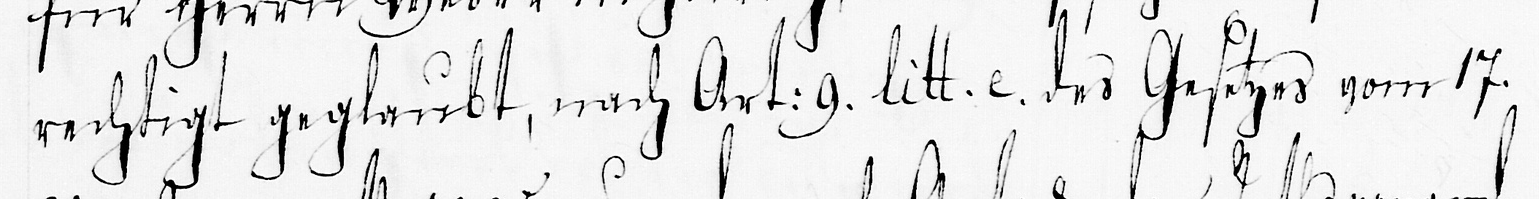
rechtigt geglaubt, nach Art: 9. litt. e. des Gesetzes vom 17.
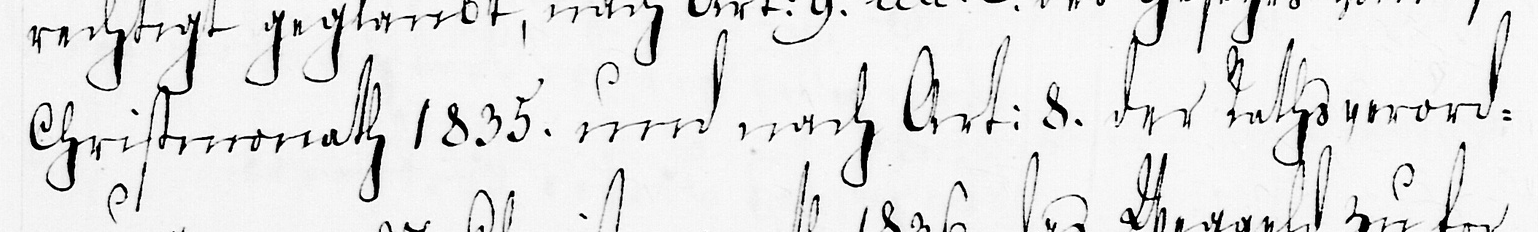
Christmonath 1835. und nach Art: 8. der Rathsverord¬
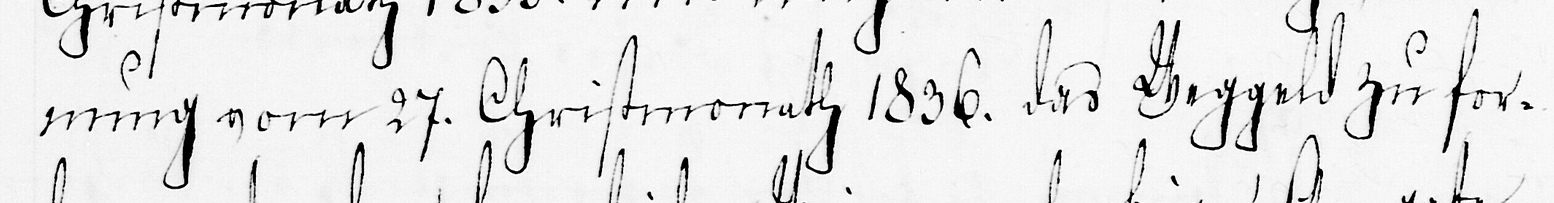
nung vom 27. Christmonath 1836. das Weggeld zu for¬
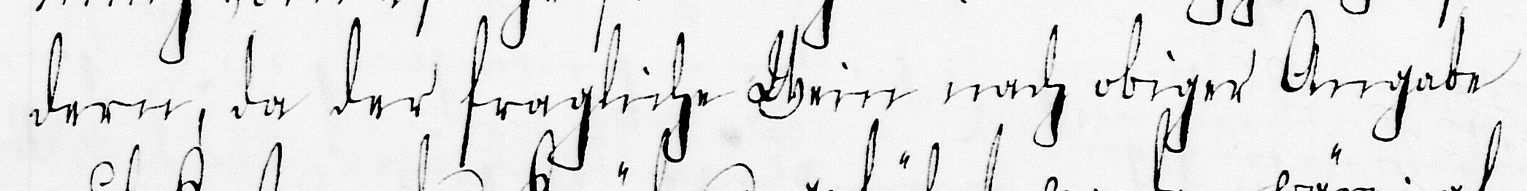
dern, da der fragliche Wein nach obiger Angabe
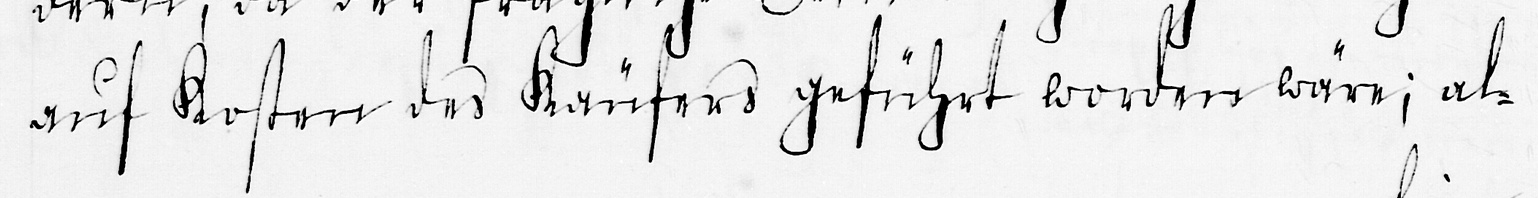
auf Kosten des Käufers geführt worden wäre; al-
